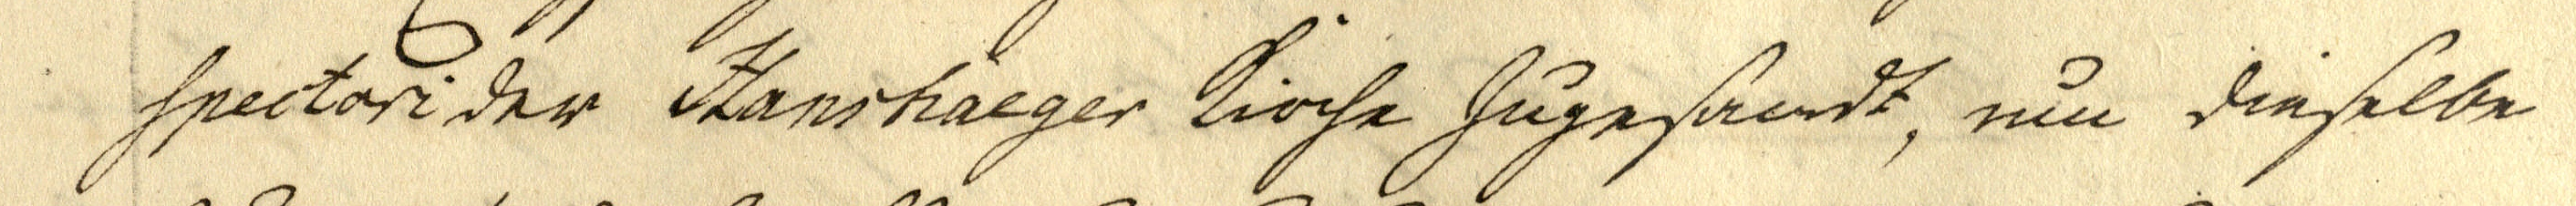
spectori der Hanshaeger Kirche zugesandt, um dieselbe
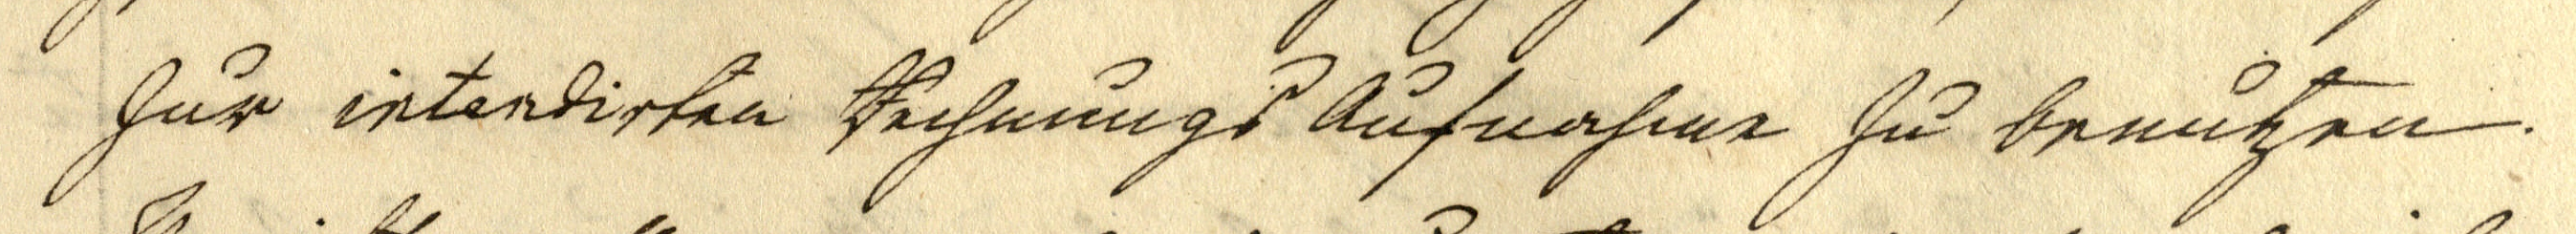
zur intendirten Rechnungs Aufnahme zu benutzen.
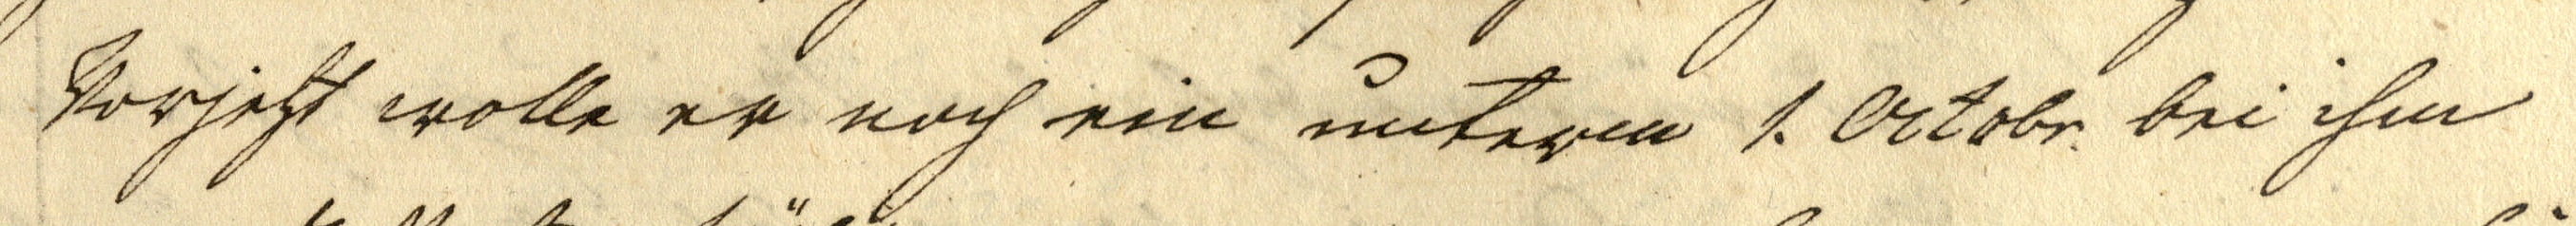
Vorjetzt wolle er noch ein unterm 1. Octobr. bei ihm
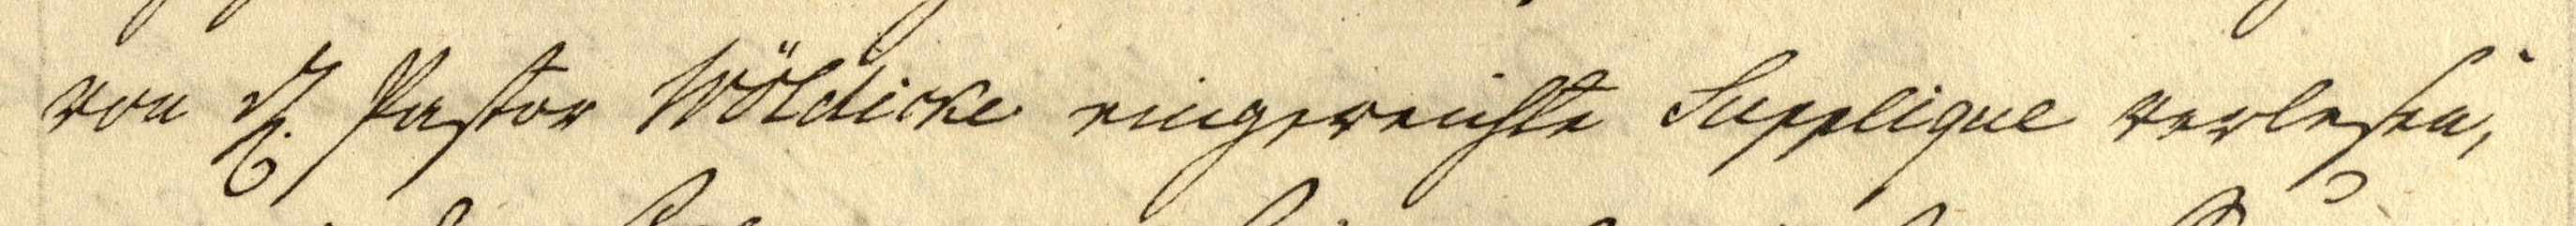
von dh. Pastor Wöldicke eingereichte Supplique verlesen,
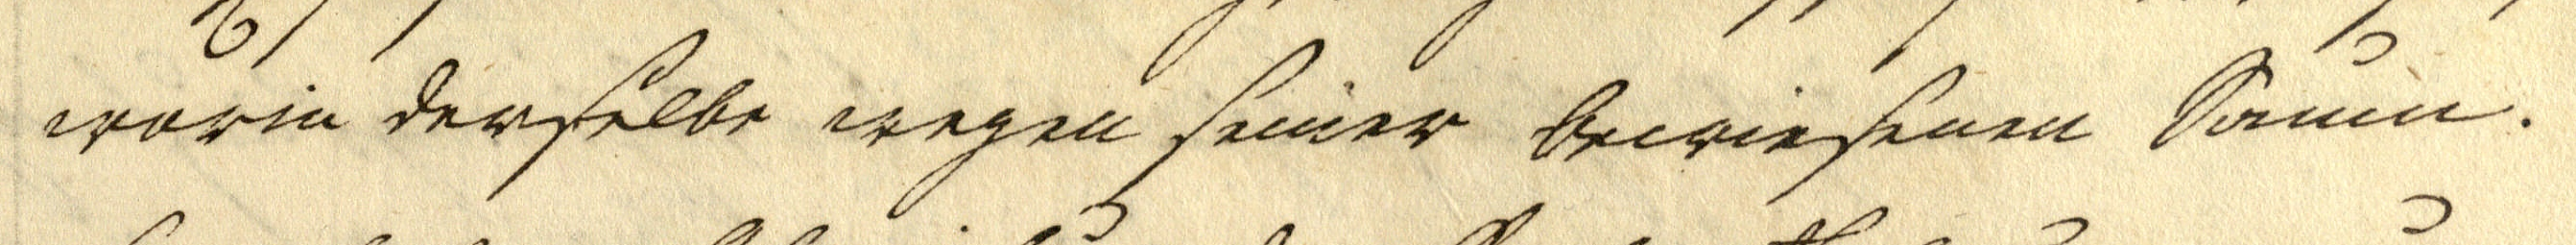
worin derselbe wegen seiner bewiesenen Saum-
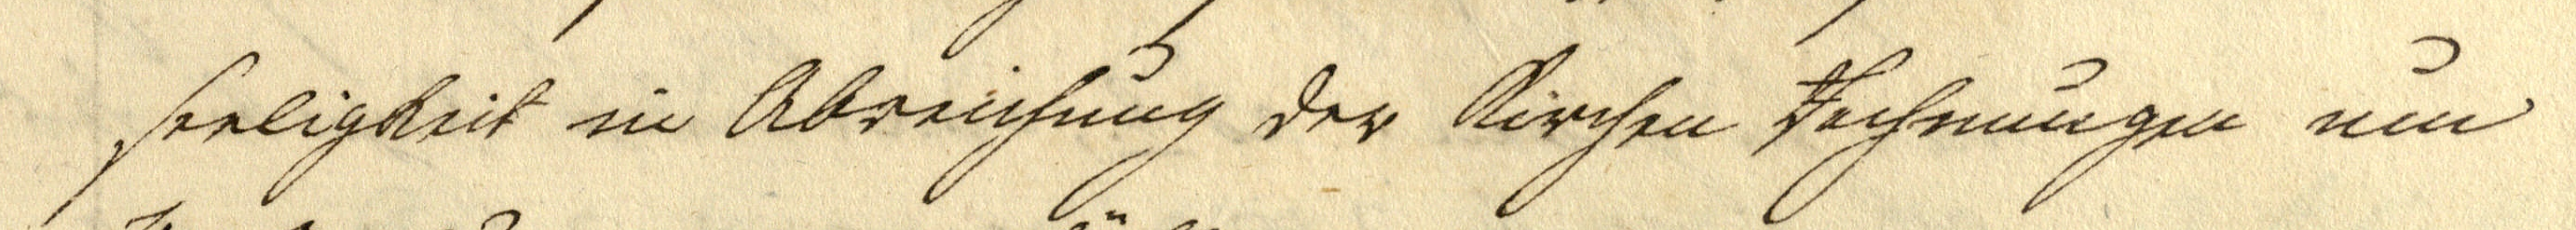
seeligkeit in Abreichung der Kirchen Rechnungen um
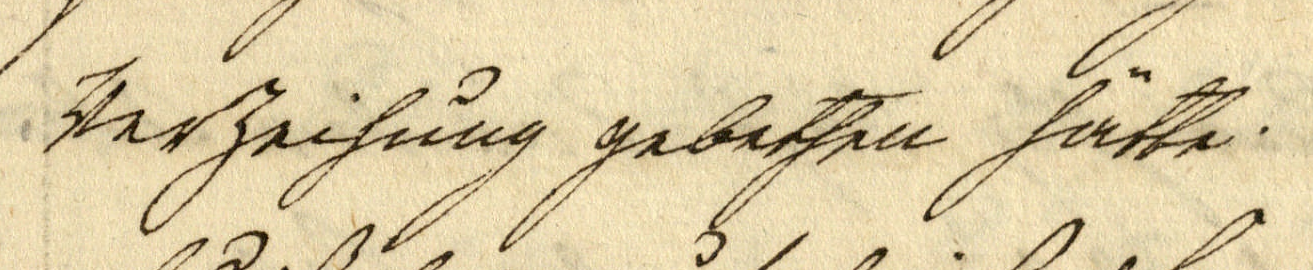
Verzeihung gebethen hätte.
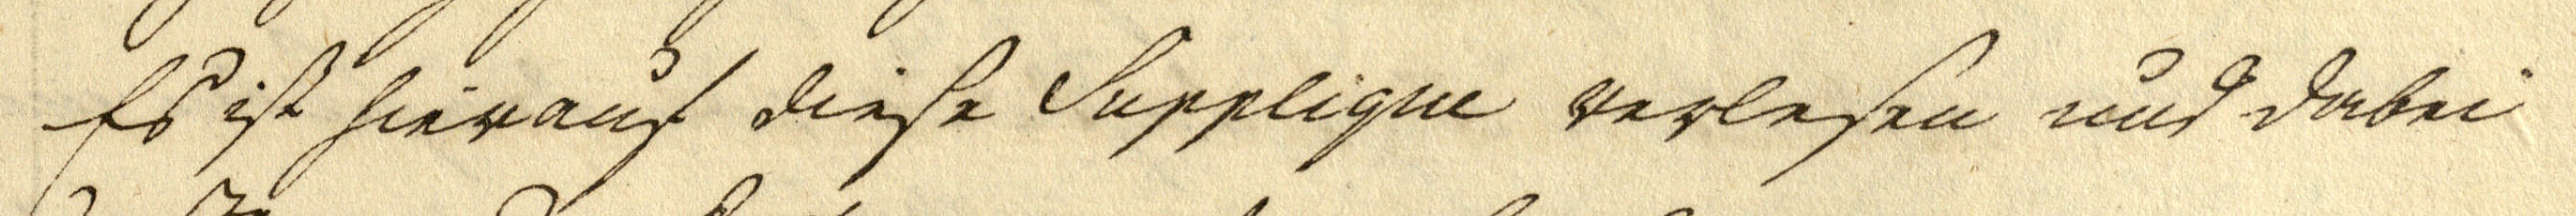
Es ist hierauf diese Supplique verlesen und dabei
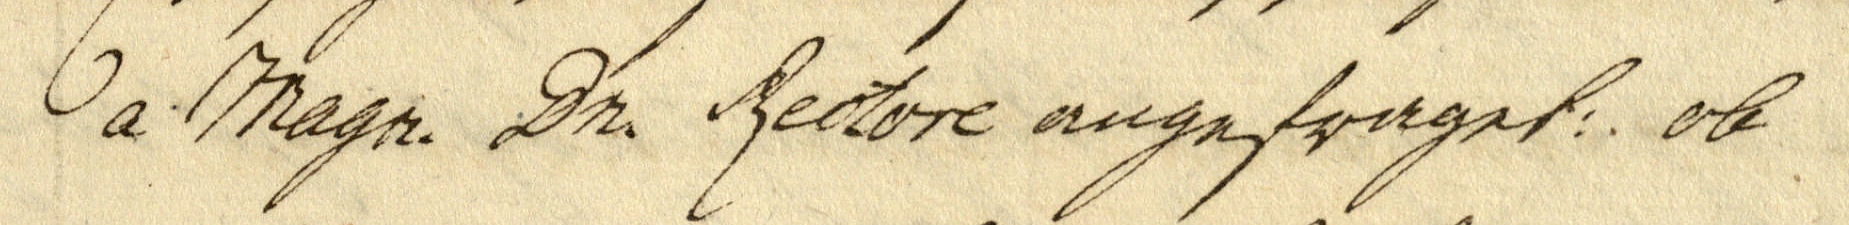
a Magn. Dn. Rectore angefraget: ob
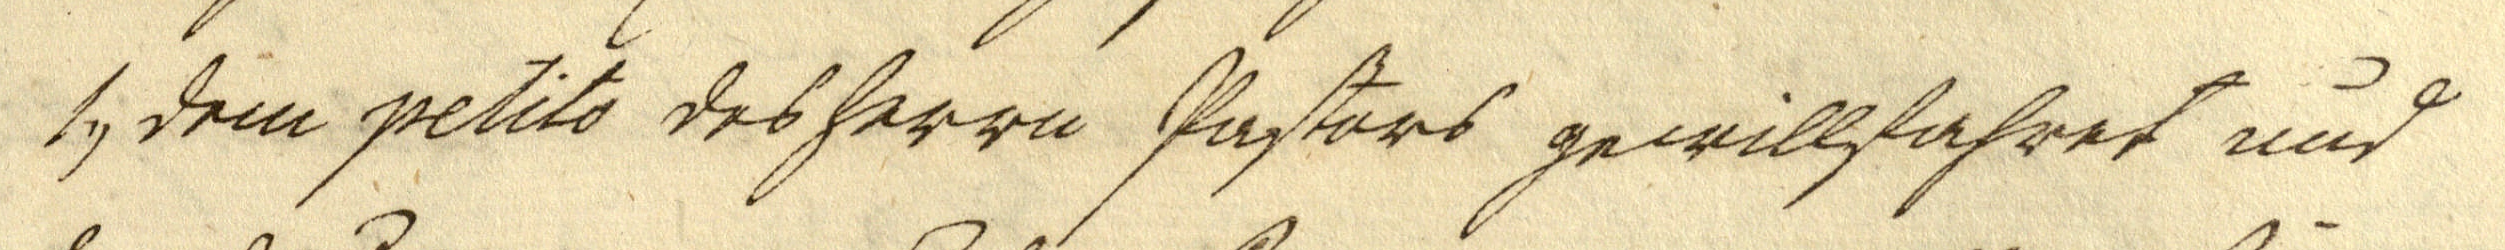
1., dem petito des herrn Pastors gewillfahret und
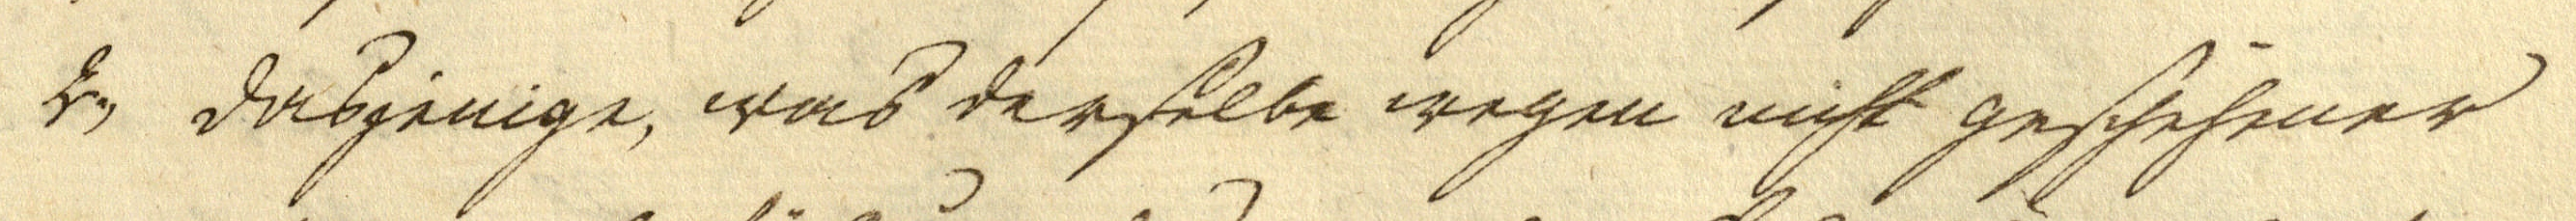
2., dasjenige, was derselbe wegen nicht geschehener
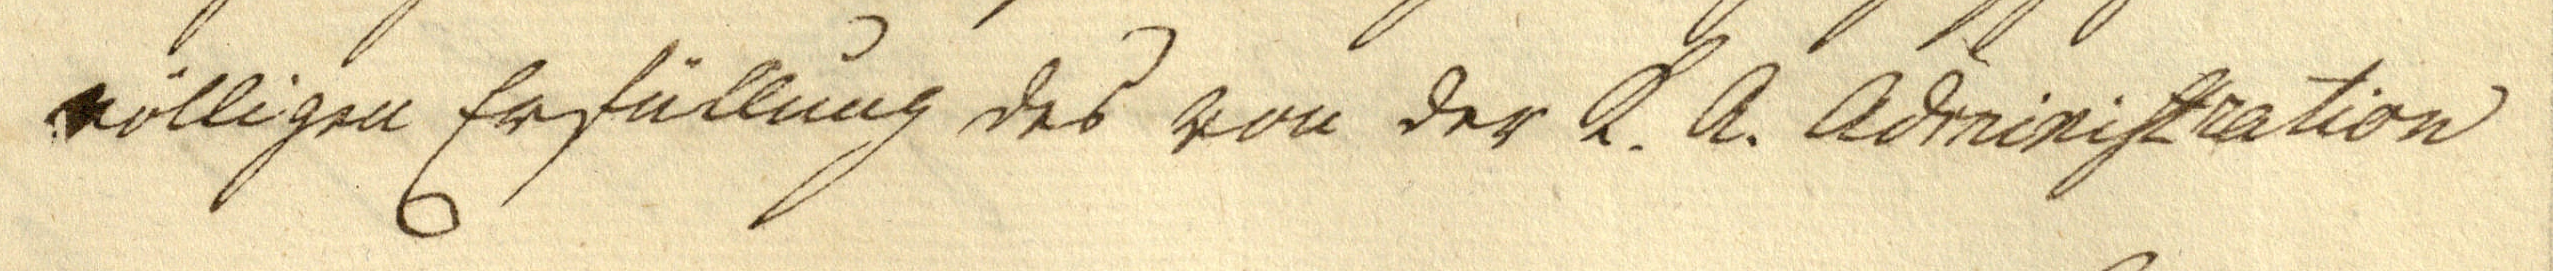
völligen Erfüllung des von der K. A. Administration
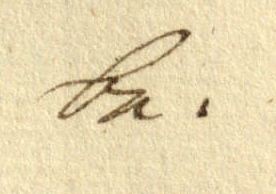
be-
